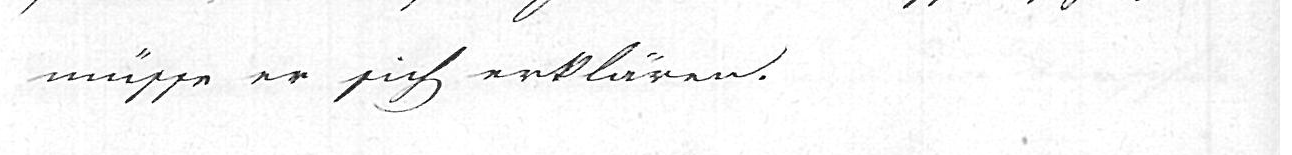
müsse er sich erklären.
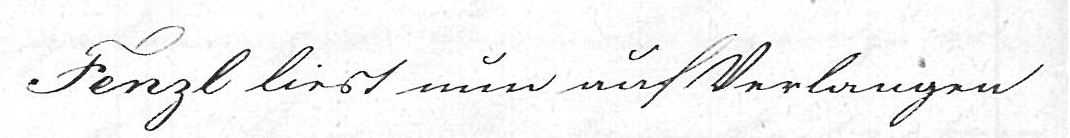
Fenzl liest nun auf Verlangen
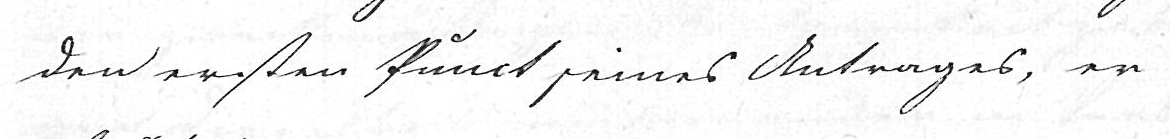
den ersten Punct seines Antrages, er
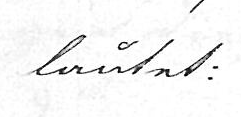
lautet:
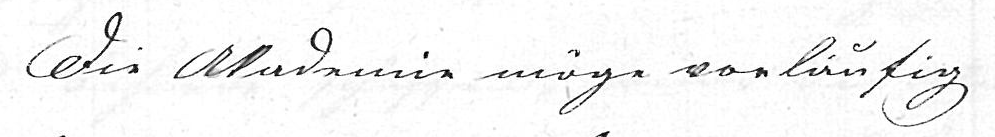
Die Akademie möge vorläufig
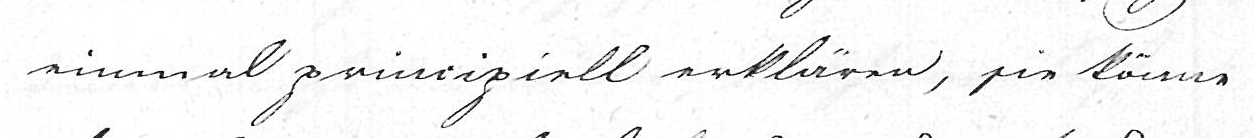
einmal prinzipiell erklären, sie könne
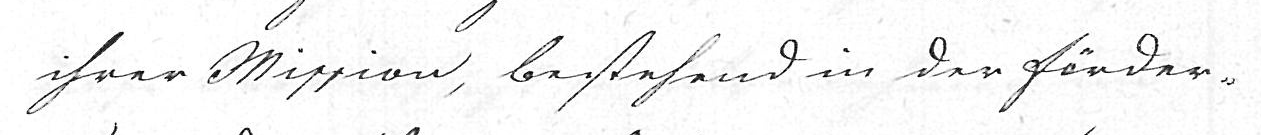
ihrer Mission, bestehend in der Föder-
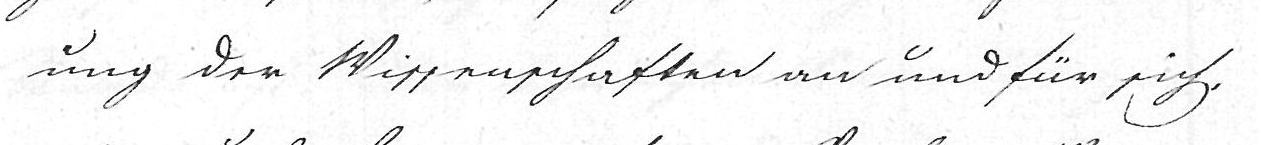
ung der Wissenschaften an und für sich
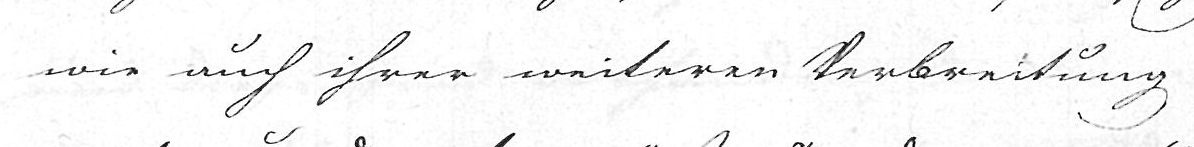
wie auch ihrer weiteren Verbreitung-
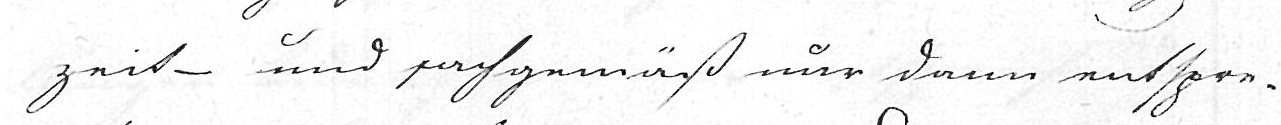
zeit- und sachgemäß nur dann entspre-
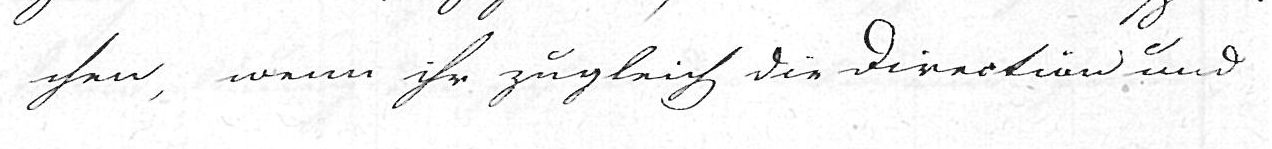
chen, wenn ihre zugleich die Direction und
